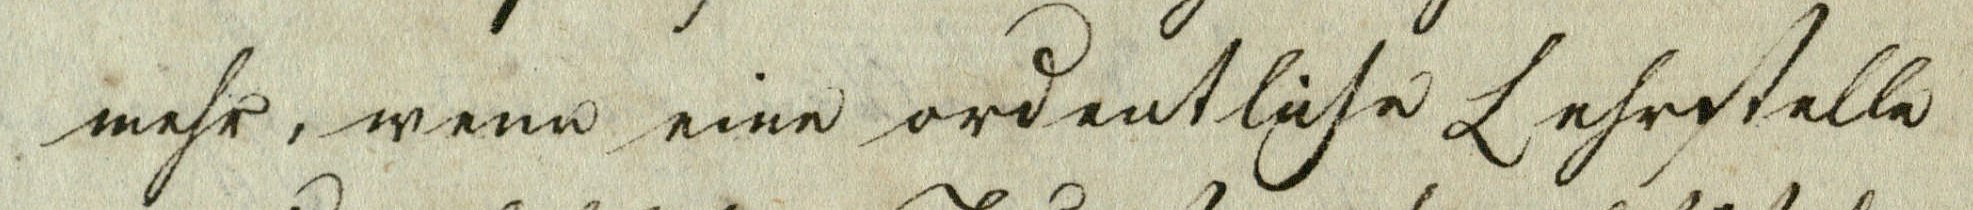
mehr, wenn eine ordentliche Lehrstelle
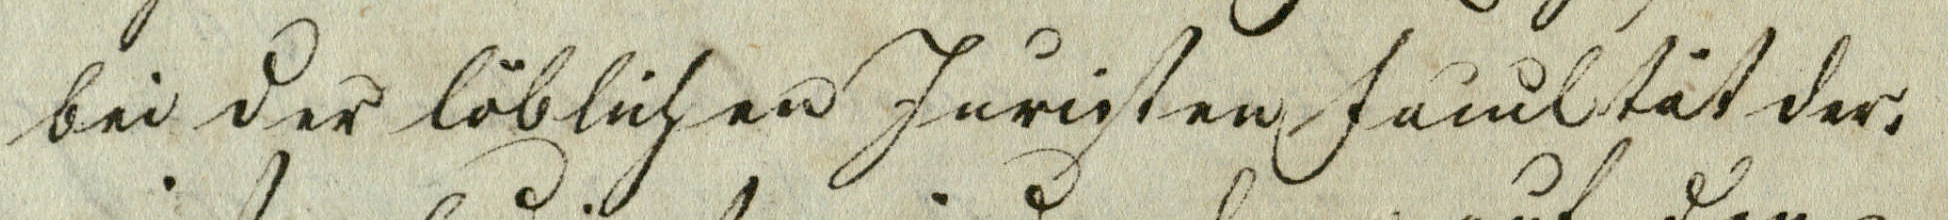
bei der löblichen Juristen Facultät der¬
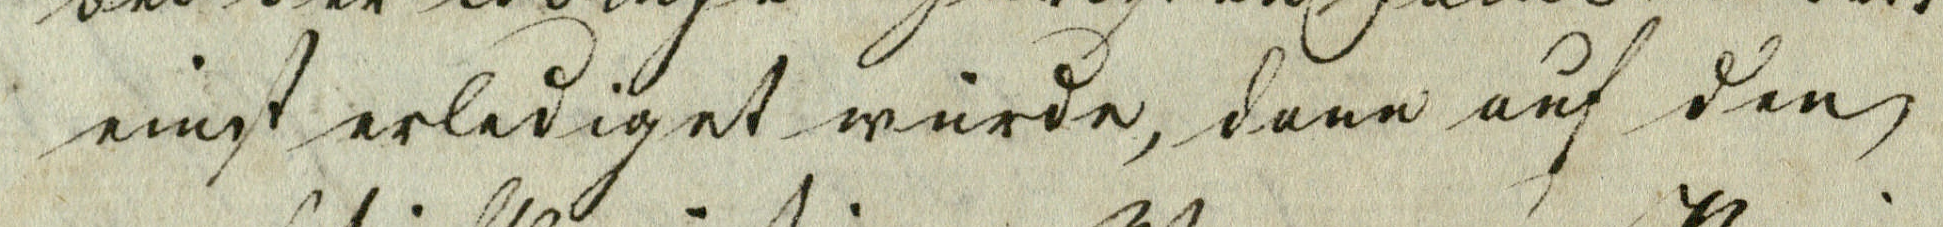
einst erlediget würde, dann auf den
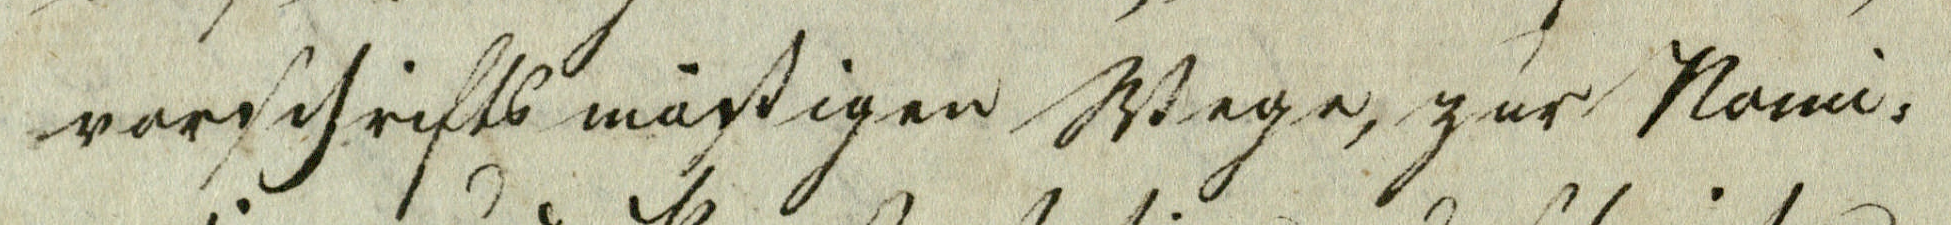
vorschriftsmäßigen Wege, zur Nomi¬
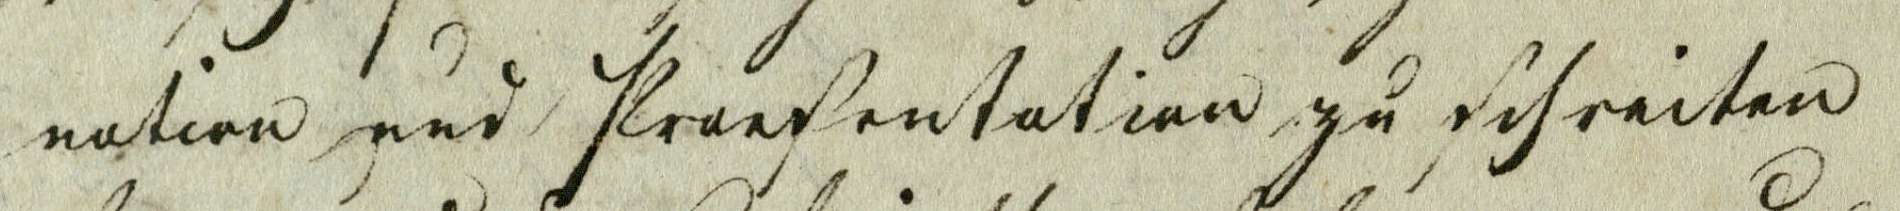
nation und Praesentation zu schreiten
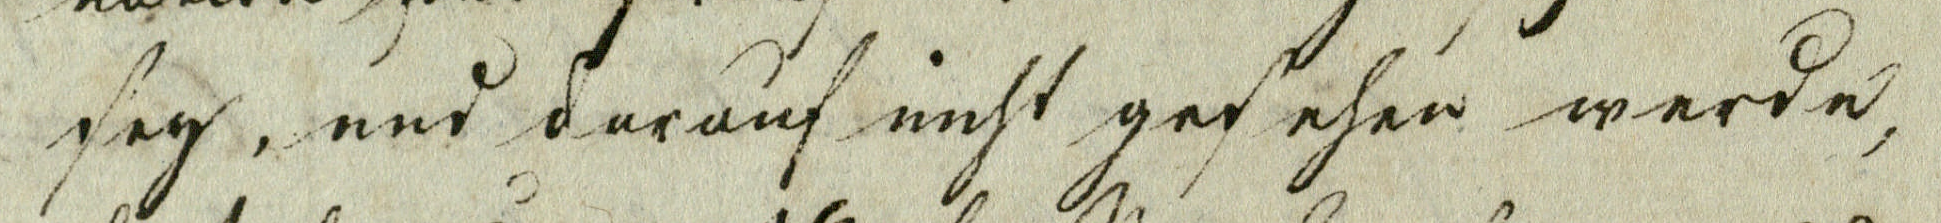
sey, und darauf nicht gesehen werde,
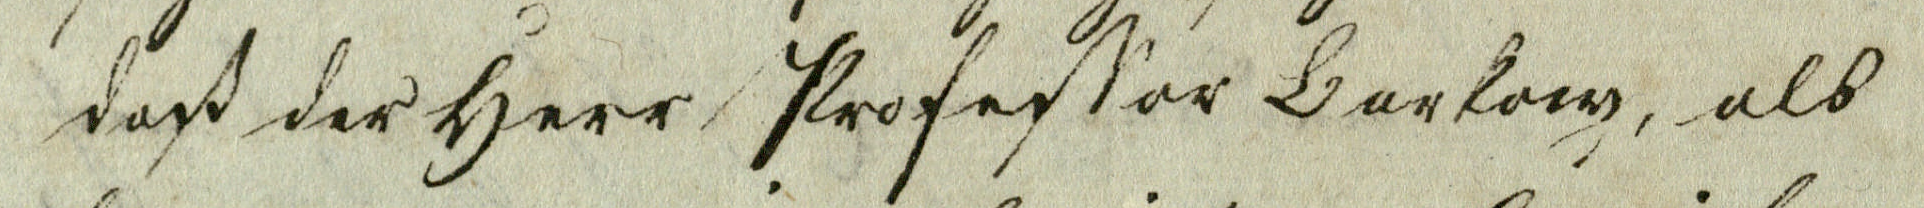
daß der Herr Professor Barkow, als
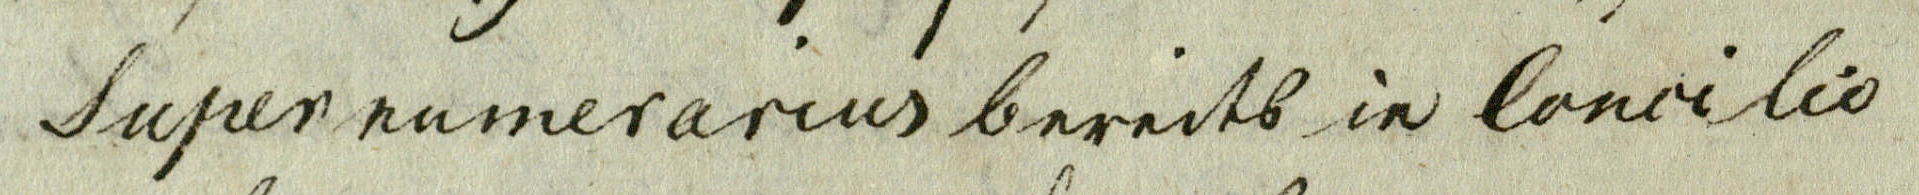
Supernumerarius bereits in Concilio
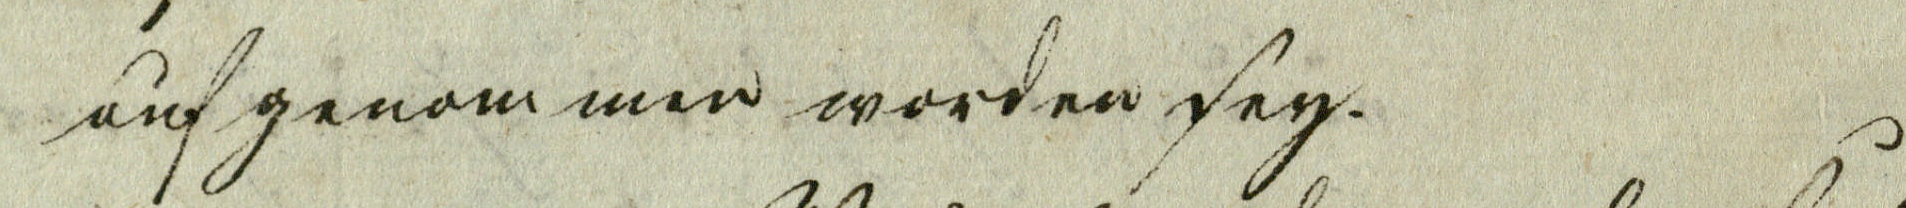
aufgenommen worden sey.
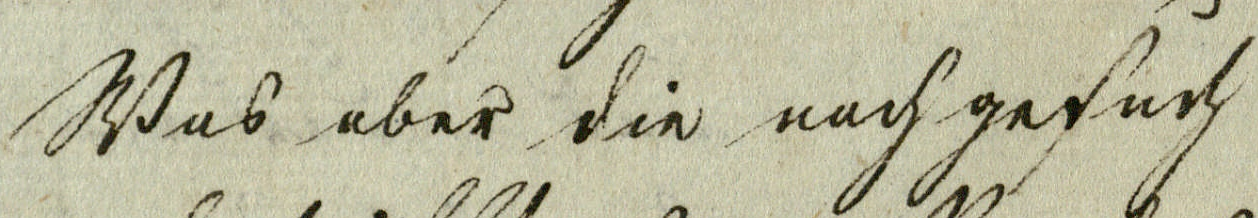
Was aber die nachgesuch¬
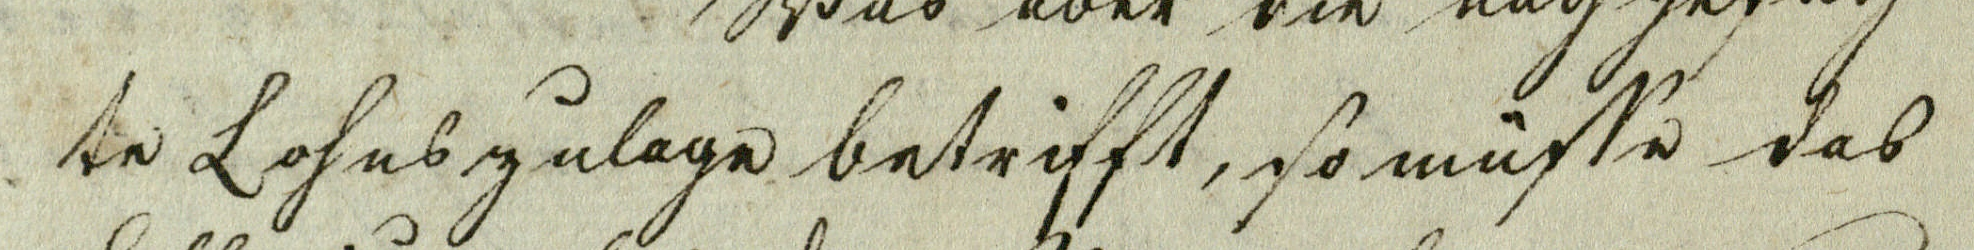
te Lohnszulage betrifft, so müßte das
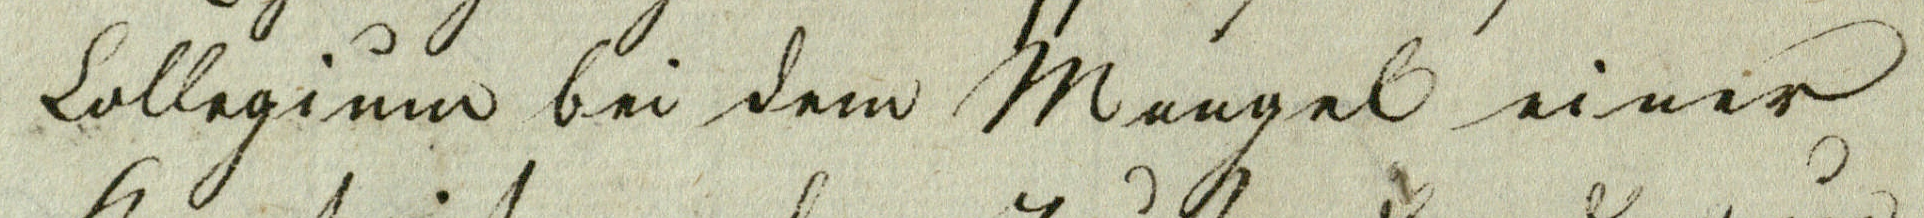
Collegium bei dem Mangel einer
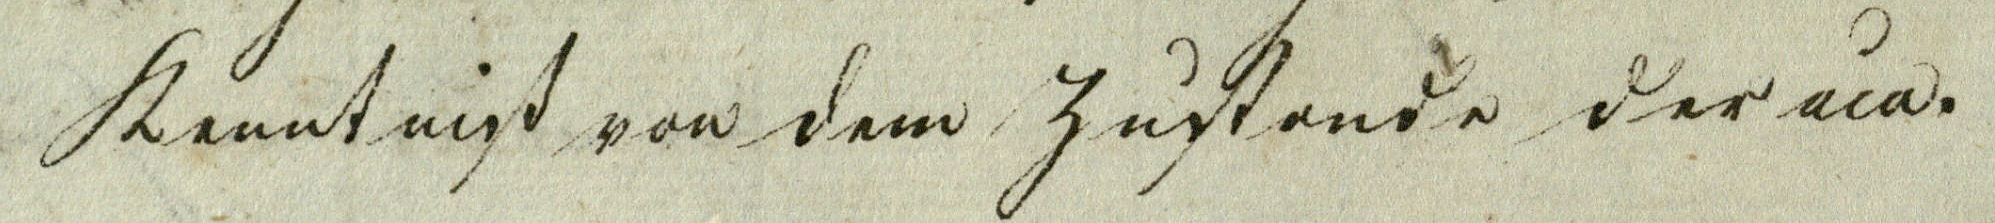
Kenntniß von dem Zustande der aca¬
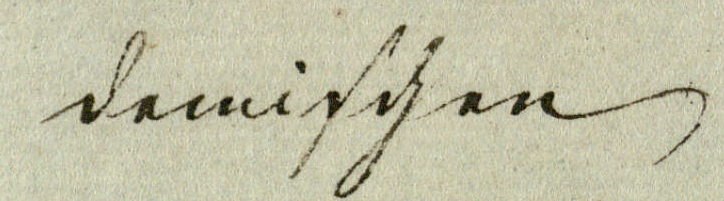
demischen
